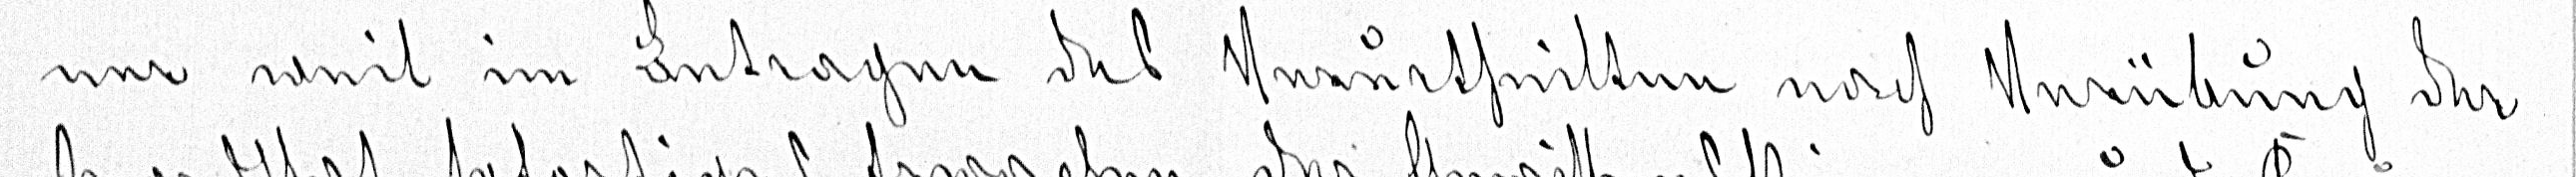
ner weil im Betragen des Verurtheilten nach Verübung der
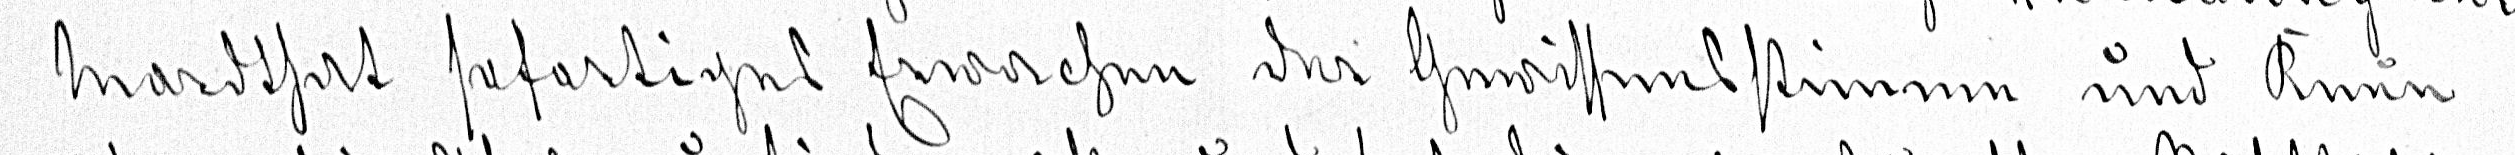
Mordthat sofortiges Erwachen der Gewissensstimme und Reue
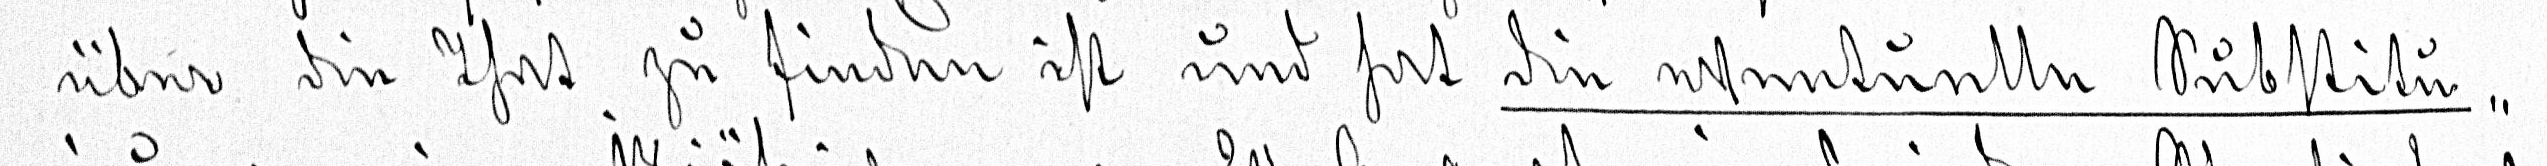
über die That zu finden ist und hat die eventuelle Substitu¬
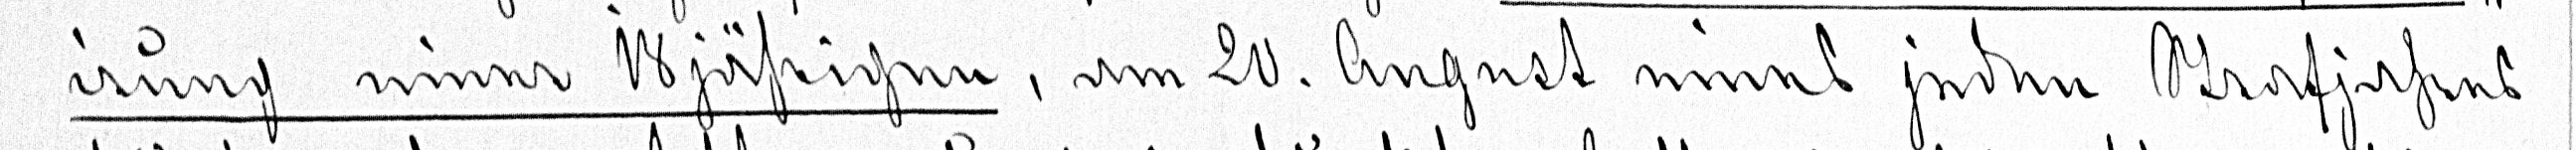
irung einer 18jährigen, am 20. August eines jeden Strafjahres
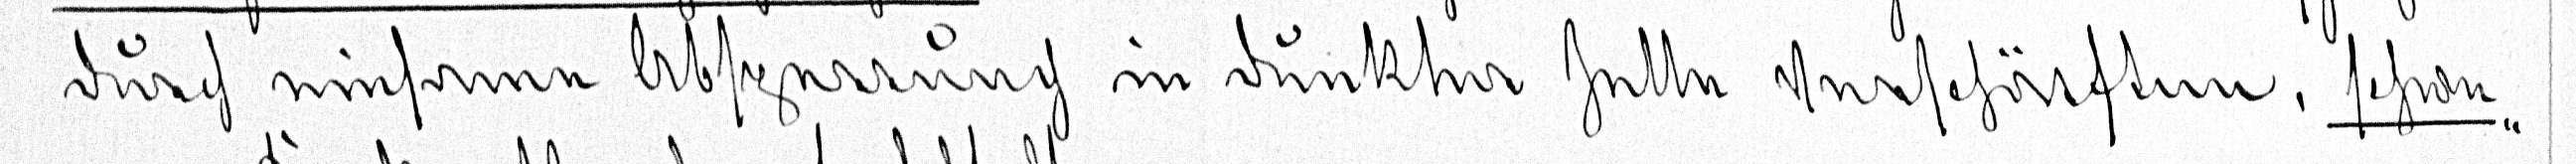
durch einsame Absperrung in dunkler Zelle verschärften, schwe¬
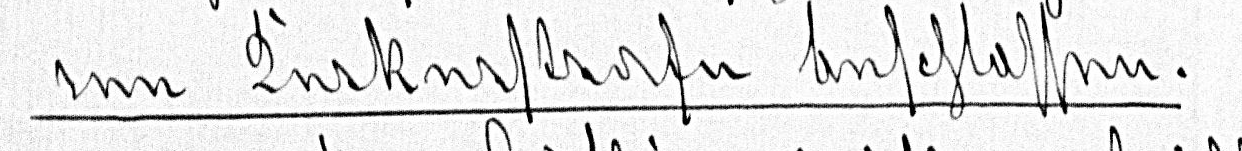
ren Kerkerstrafe beschlossen.
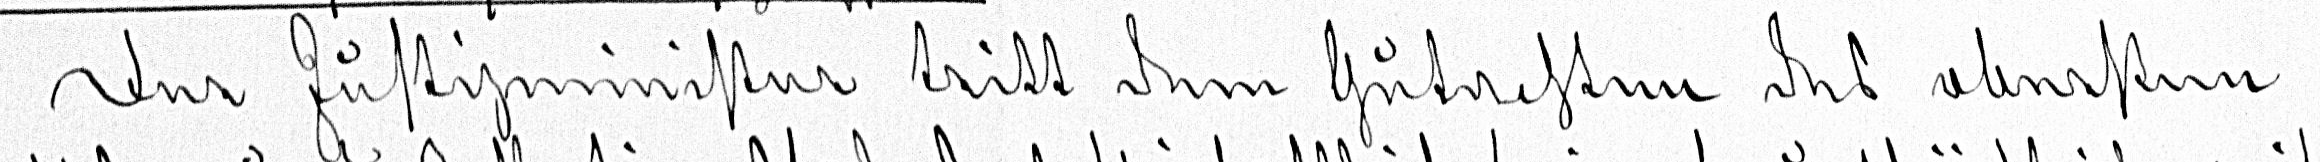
Der Justizminister tritt dem Gutachten des obersten
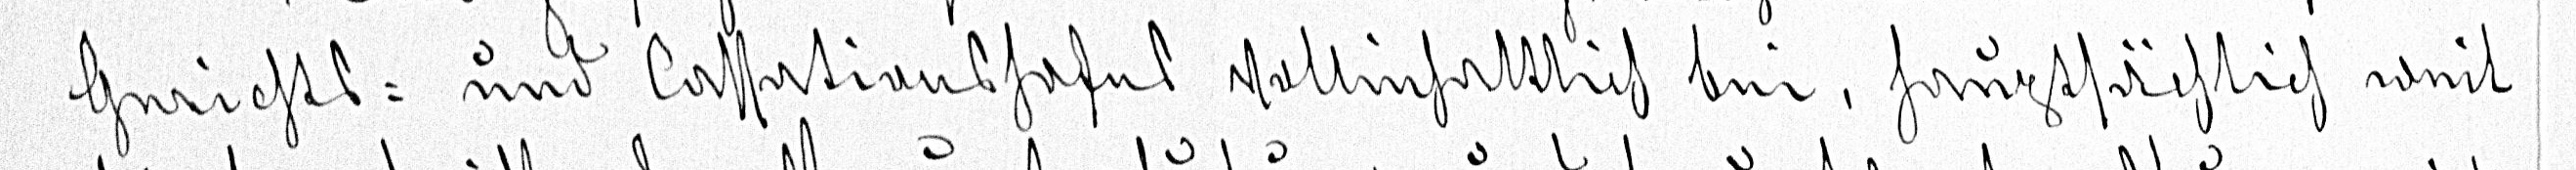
Gerichts- und Cassationshofes vollinhaltlich bei, hauptsächlich weil
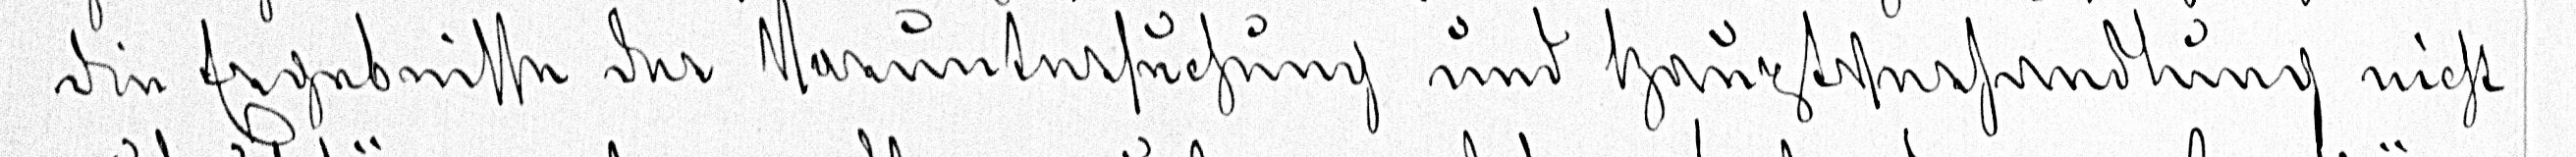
die Ergebnisse der Voruntersuchung und Hauptverhandlung nicht
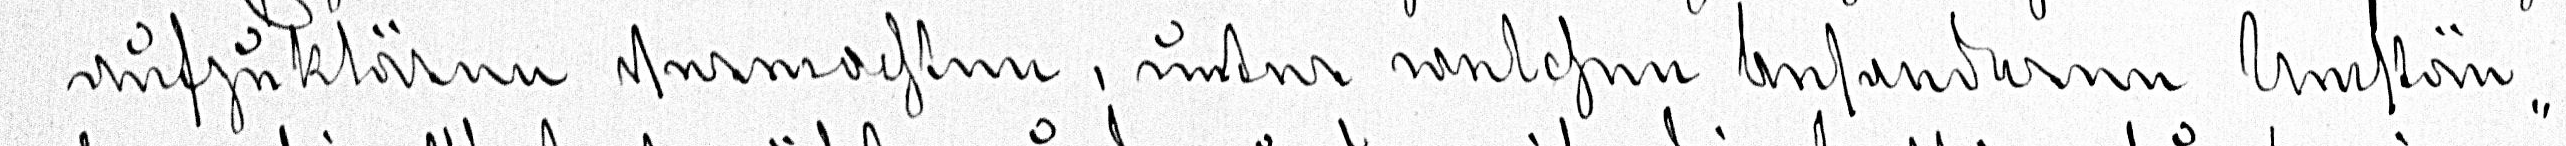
aufzuklären vermoachten, unter welchen besonderen Umstän¬
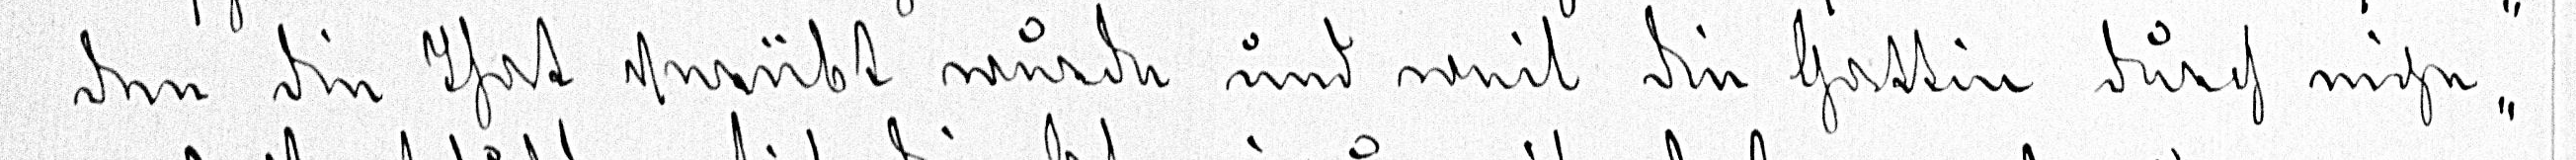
den die That verübt wurde und weil die Gattin durch eige¬
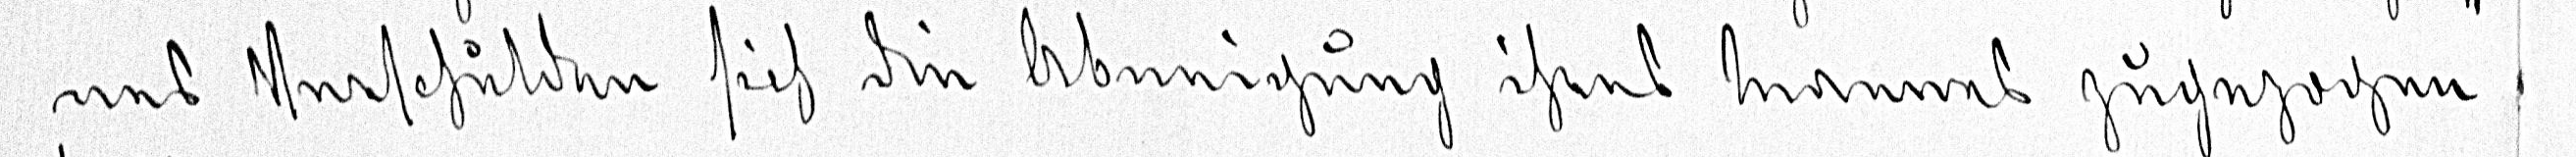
nes Verschulden sich die Abneigung ihres Mannes zugezogen
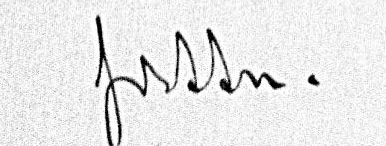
hatte.
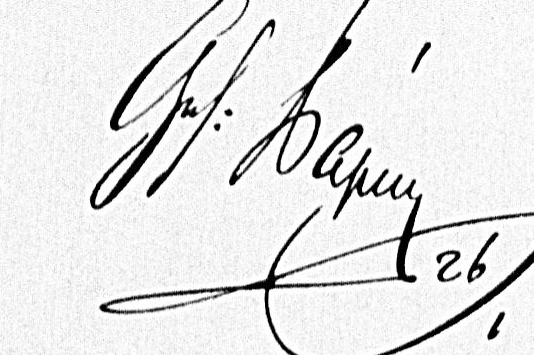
Ges: xx
